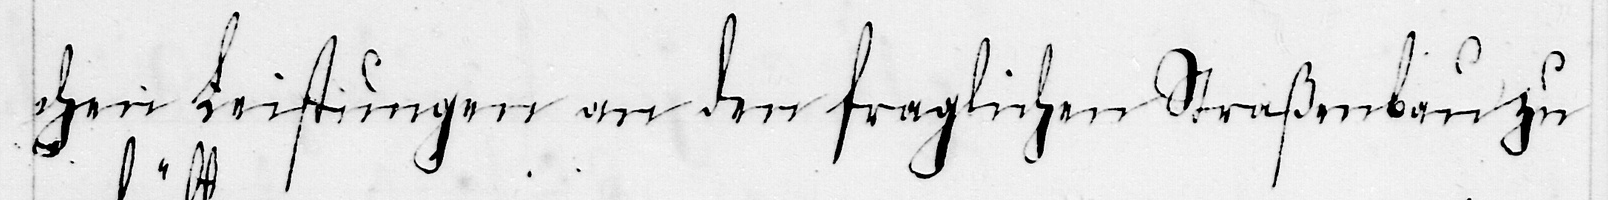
chen Leistungen an den fraglichen Straßenbau zu
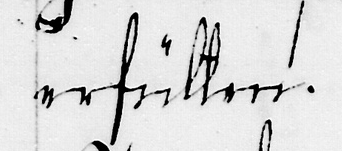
erfüllen.
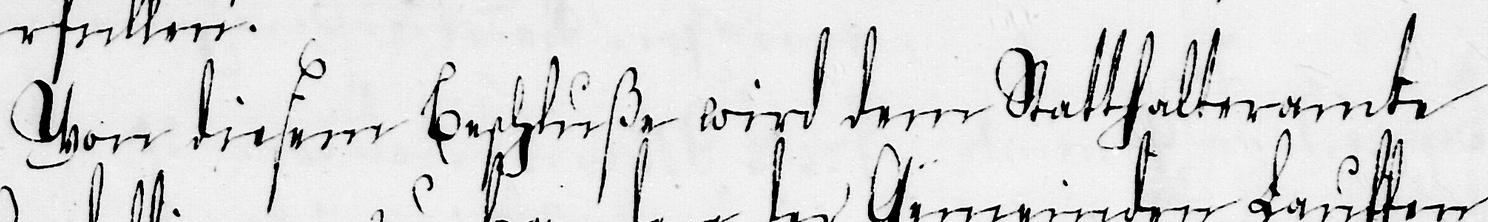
Von diesem Beschluße wird dem Statthalteramte
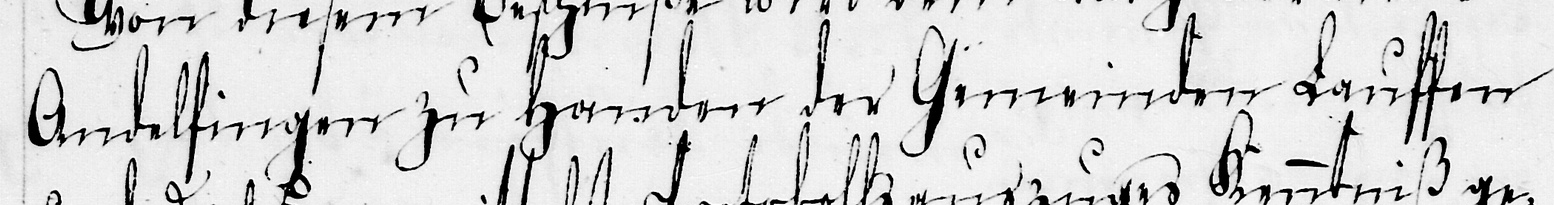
Andelfingen zu Handen der Gemeinden Lauffen
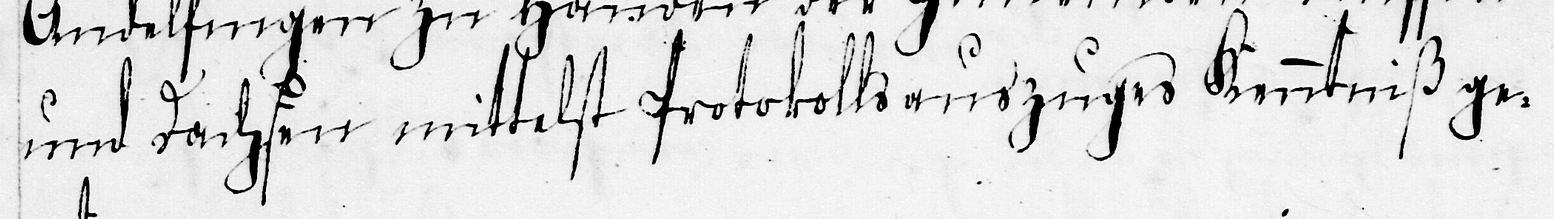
und Dachsen mittelst Protokollsauszuges Kenntniß ge¬
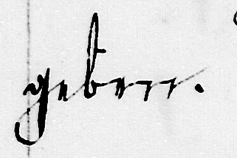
geben.
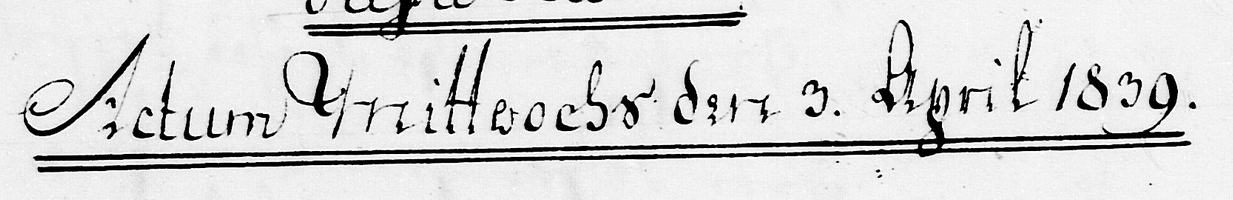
Actum Mittwochs den 3. April 1839.
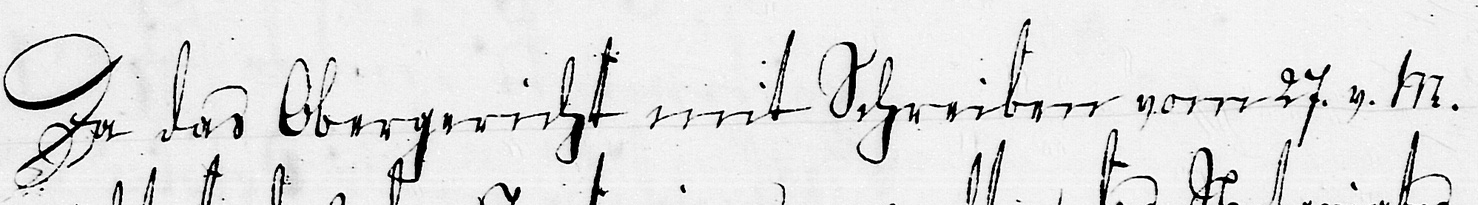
Da das Obergericht mit Schreiben vom 27. v. M.
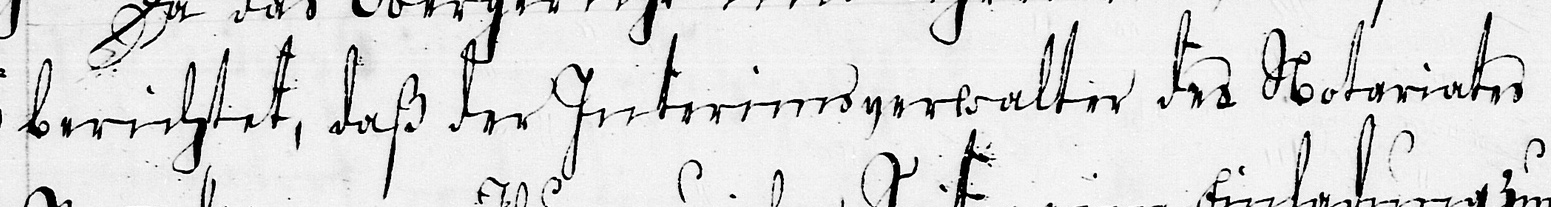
berichtet, daß der Interimsverwalter des Notariates
